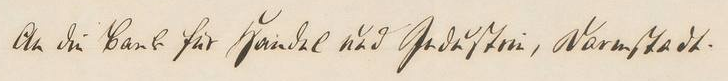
An die Bank für Handel und Industrie, Darmstadt.
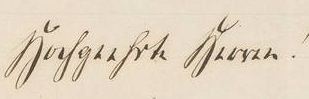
Hochgeehrte Herren!
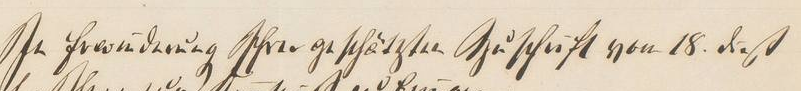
In Erwiederung Ihrer geschätzten Zuschrift vom 18. dieß
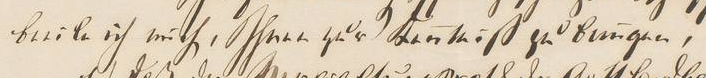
beeile ich mich, Ihnen zur Kenntniß zu bringen,
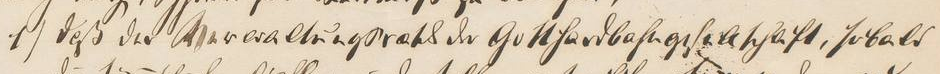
1) daß der Verwaltungsrath der Gotthardbahngesellschaft, sobald
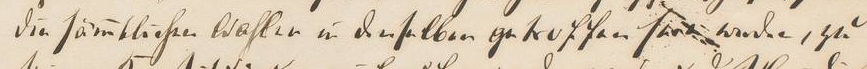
die sämmtlichen Wahlen in denselben getroffen sein werden, zu
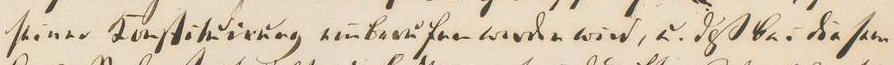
seiner Konstituirung einberufen werden wird, u. dss bei diesem
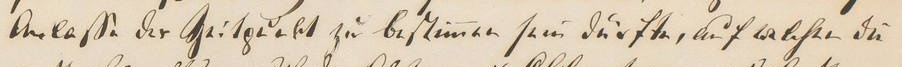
Anlasse der Zeitpunkt zu bestimmen sein dürfte, auf welchen die
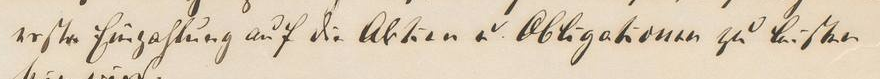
erste Einzahlung auf die Aktien u. Obligationen zu leisten
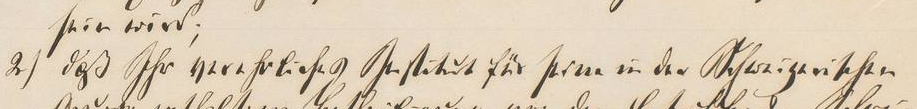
2) daß Ihr verehrliches Institut für seine in der Schweizerischen
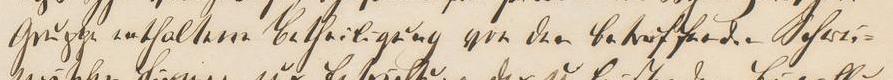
Gruppe enthaltene Betheiligung von den betreffenden Schwei-
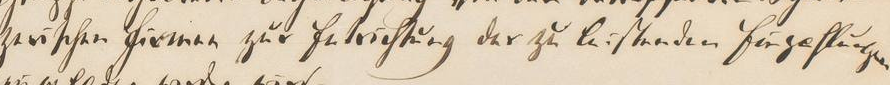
zerischen Firmen zur Entrichtung der zu leistenden Einzahlungen
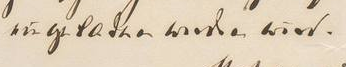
eingeladen werden wird.
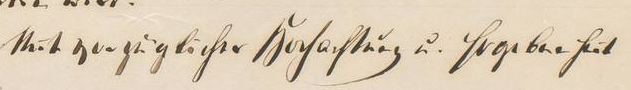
Mit vorzüglicher Hochachtung u. Ergebenheit
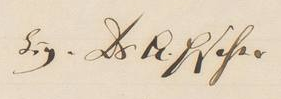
sig. Dr A. Escher
